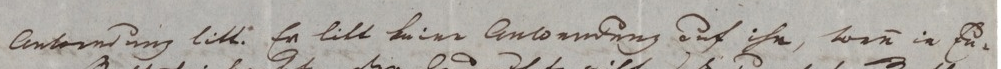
Anwendung litt. Er litt keine Anwendung auf ihn, wenn in Eu-
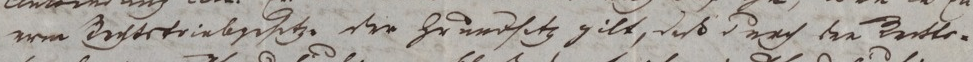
erm Rechtstriebgesetze der Grundsatz gilt, daß durch den Rechts-
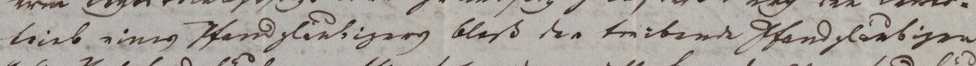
trieb eines Pfandgläubigers bloß der treibende Pfandgläubiger
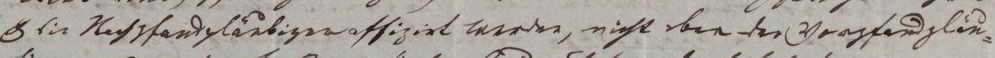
& die Nachpfandgläubiger affizirt werden, nicht aber der Vorpfandgläu-
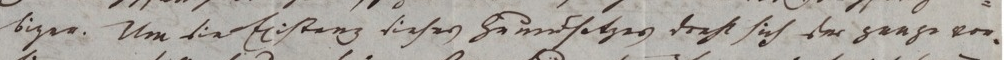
biger. Um die Existenz dieses Grundsatzes dreht sich der ganze vor-
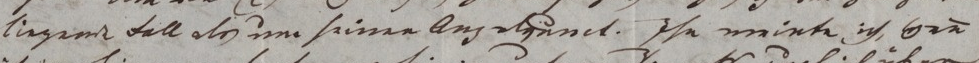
liegende Fall als um seinen Angelpunct. Ihn meinte ich, wenn
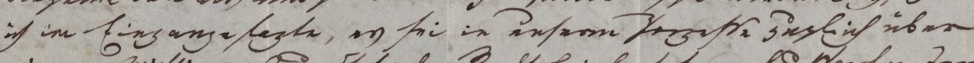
ich im Eingange sagte, es sei in unserm Prozesse zugleich über
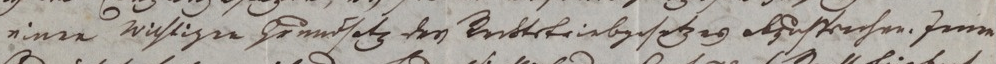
einen wichtigen Grundsatz des Rechtstriebgesetzes abzusprechen. Jenen
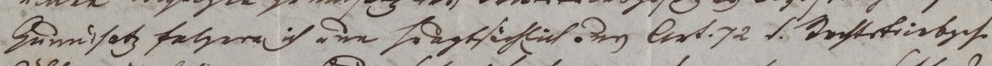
Grundsatz folgere ich nun hauptsächlich aus Art. 72 d. Rechtstriebges.
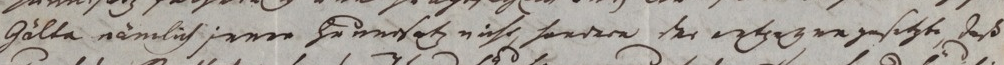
Gälte nämlich jener Grundsatz nicht, sondern der entgegengesetzte, daß
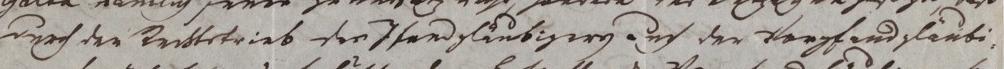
durch den Rechtstrieb des Pfandgläubigers auch der Vorpfandgläubi-
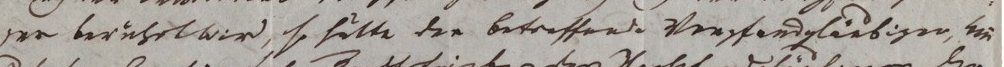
ger berührt wird, so hätte der betreffende Vorpfandgläubiger, wenn
